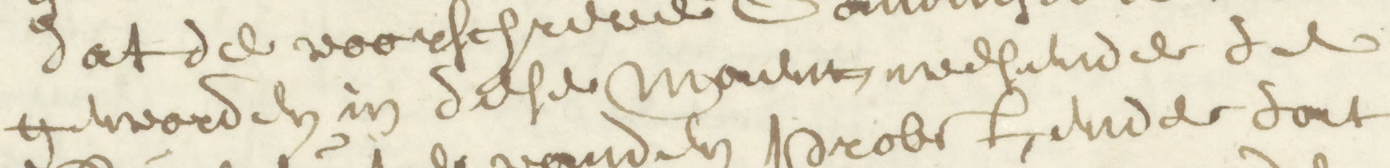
geworden in dese Maent, wesende de
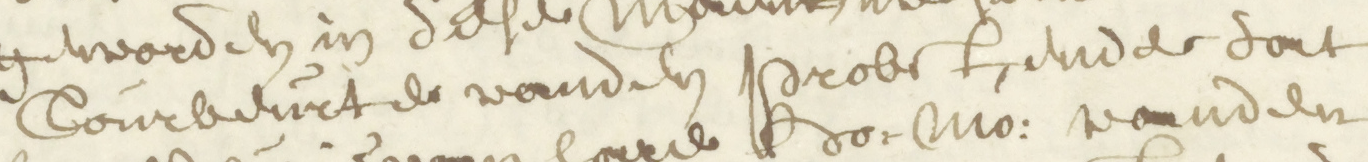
Tourbeurte vanden Probst, ende dat
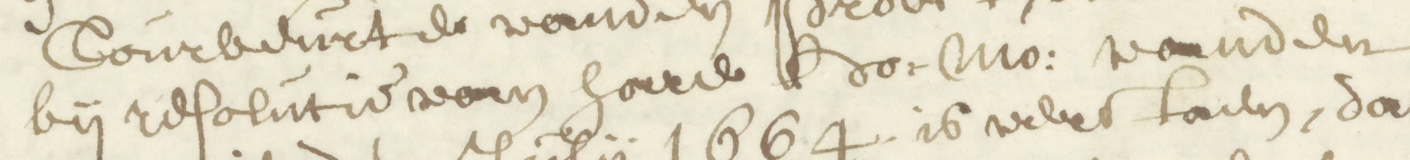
bij resolutie van hare Ho:Mo: vanden
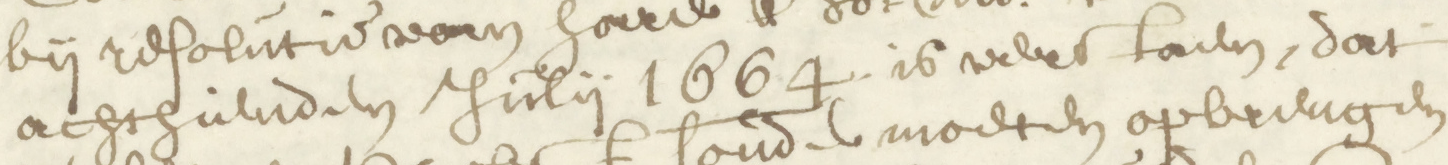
achthienden Julij 1664 is verstaen, dat
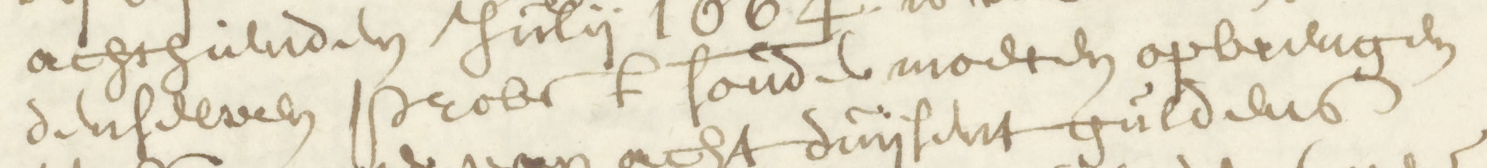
denselven Probst soude moeten opbrengen
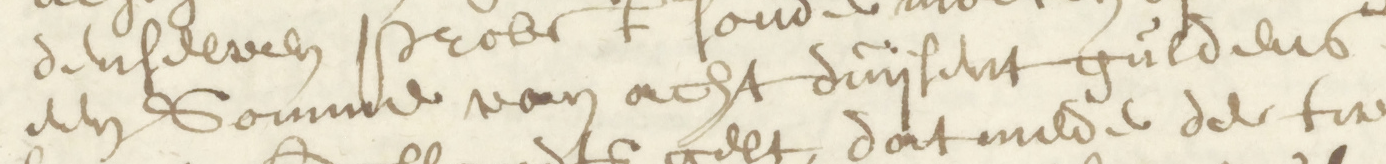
een Somme van achtduijsent guldens
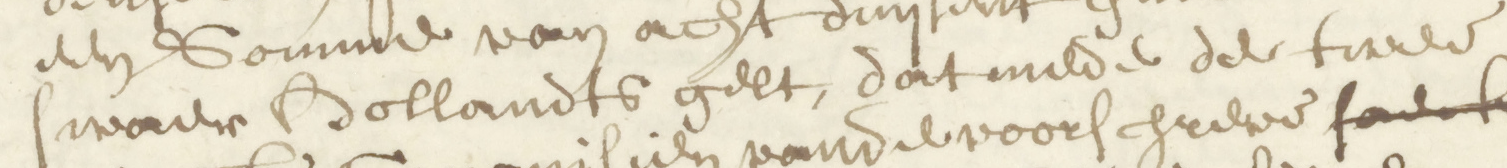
swaer Hollandts gelt, dat mede de twee
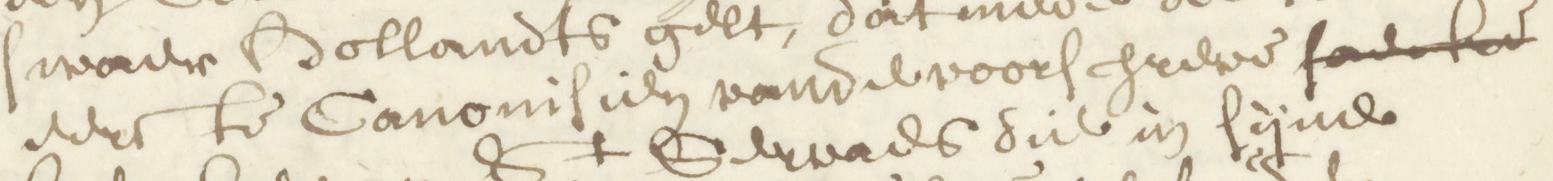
eerste Canonisien vande voorschreve saecke
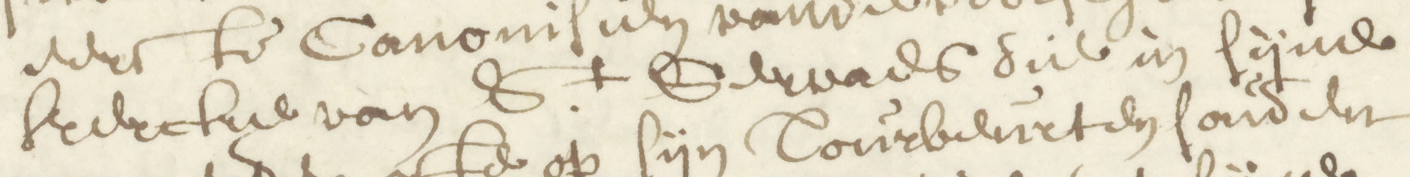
Kercke van S.t Servaes die in sijne
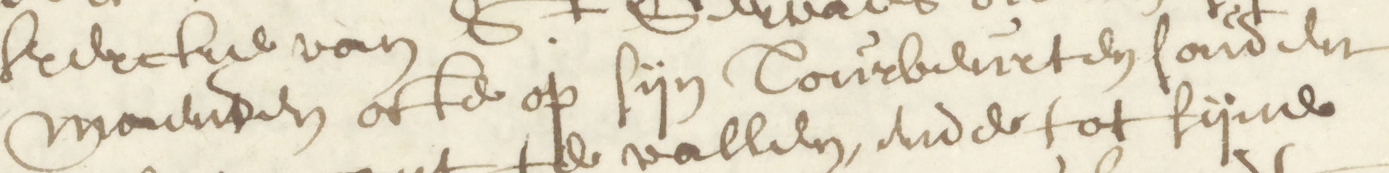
Maenden ofte op sijn Tourbeurten souden
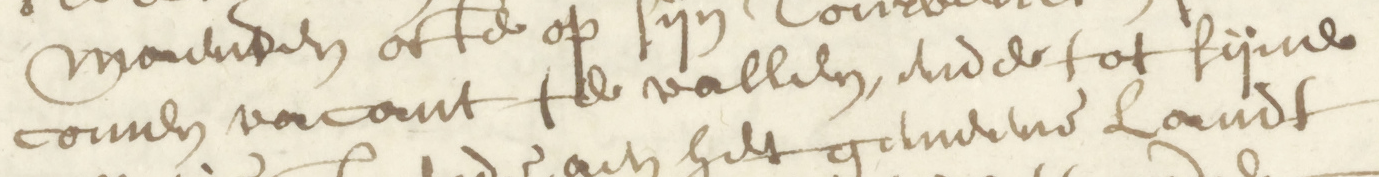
comen vacant te vallen, ende tot sijne
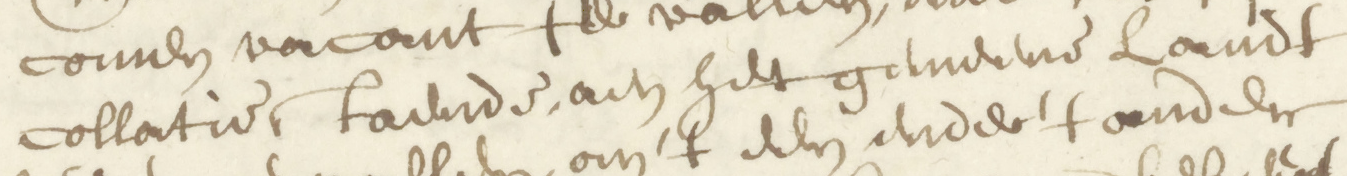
collatie staende, aen het gemeene Landt
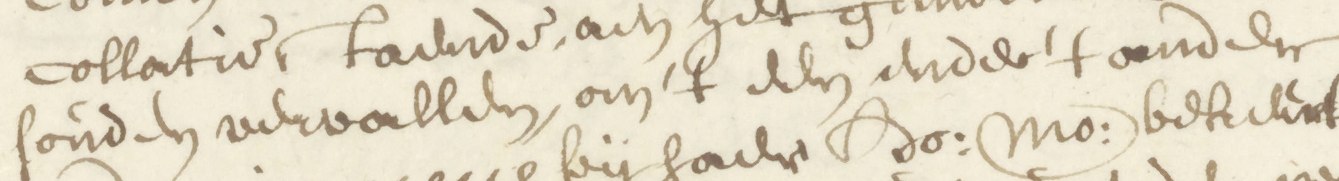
souden vervallen, om't een ende 't ander
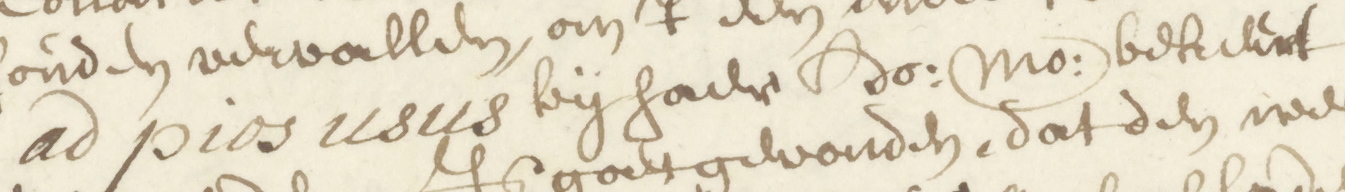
ad pios usus bij haer Ho:Mo: bekent
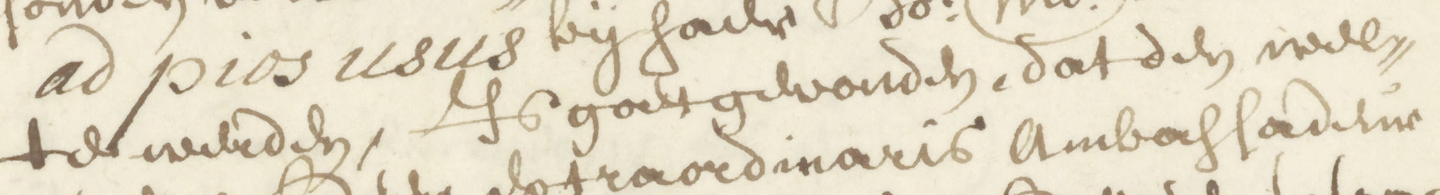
te werden. Is goetgevonden, dat den wel„
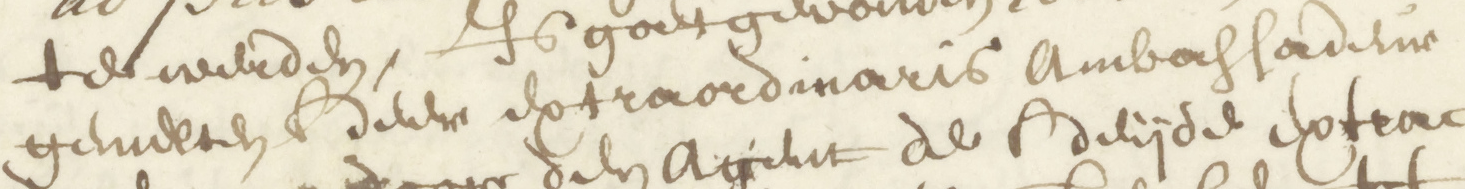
gemelten Heer extraordinaris Ambassadeur
